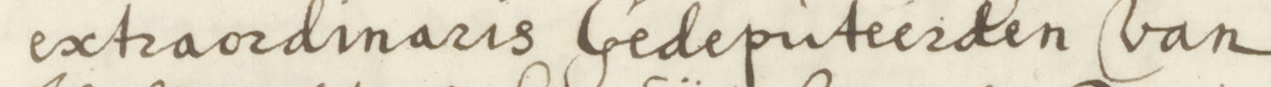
extraordinaris Gedeputeerden van
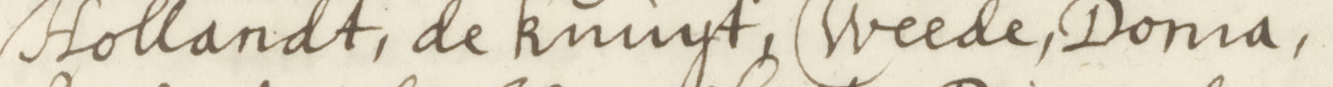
Hollandt, de Knuijt, Weede, Donia,
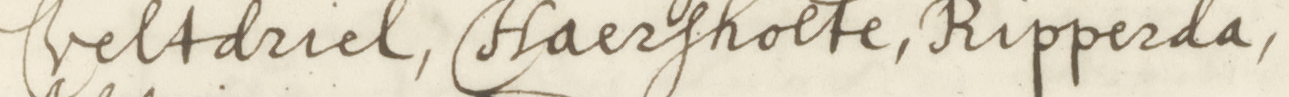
Veltdriel, Haersholte, Ripperda,
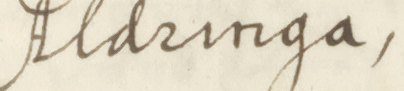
Aldringa.
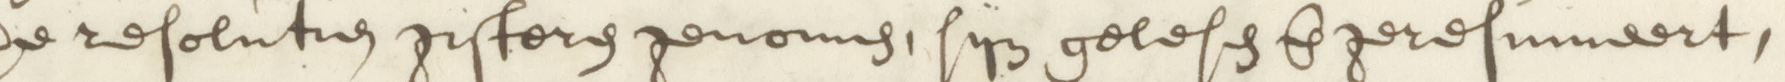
De resolutien gisteren genomen sijn gelesen & geresumeert.
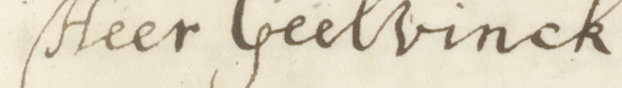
Heer Geelvinck
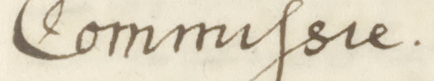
commissie
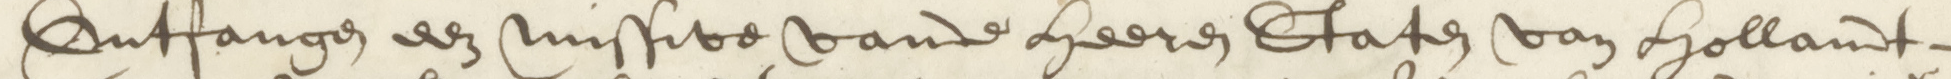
Ontfangen een missive vande heeren Staten van Hollandt
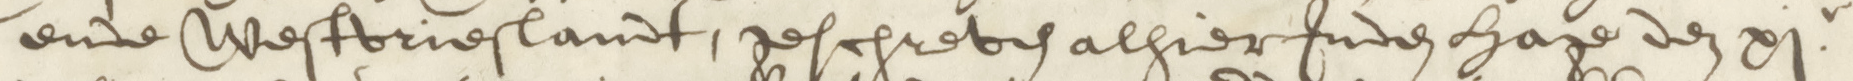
ende Westvrieslandt, geschreven alhier inden Hage den xie
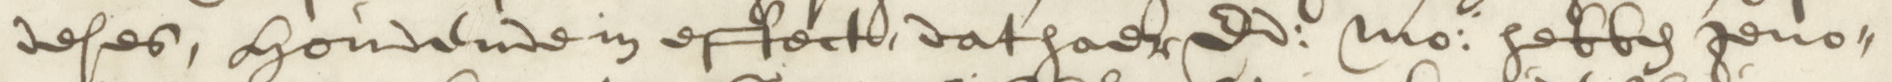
deses, houdende in effect, dat haer Ed:Mo: hebben geno„
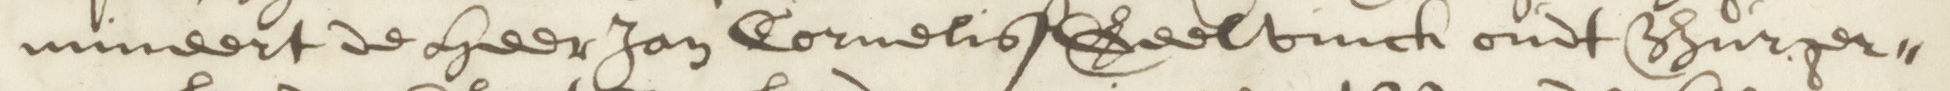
mineert de heer Jan Corneliss Geelvinck oudt Burger„
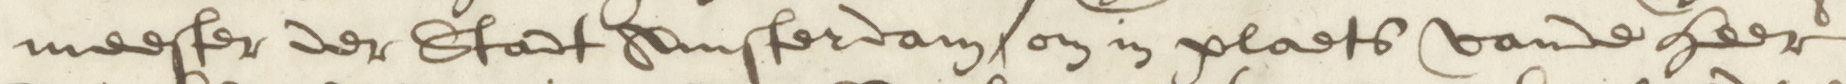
meester der Stadt Amsterdam, om in plaets vande heer
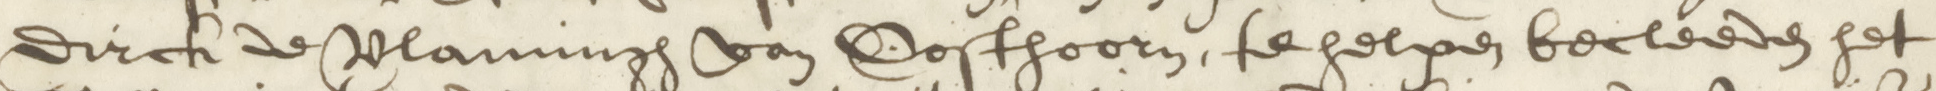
Dirck de Vlamingh van Oosthoorn, te helpen becleeden het
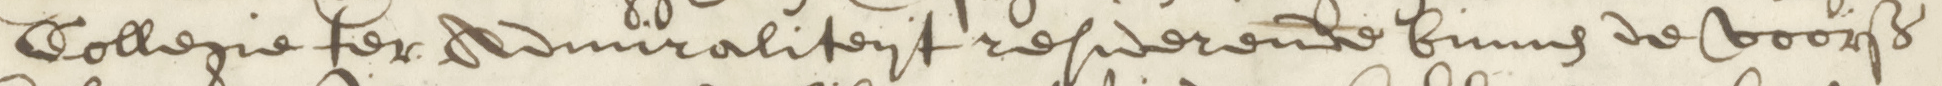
Collegie ter Admiraliteijt residerende binnen de voors
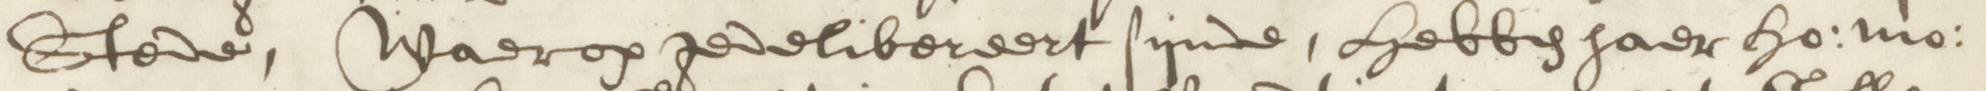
Stede. Warop gedelibereert sijnde, hebben haer Ho:Mo:
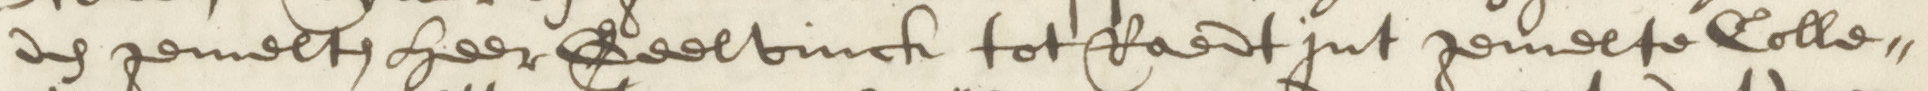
den gemelten heer Geelvinck tot Raedt int gemelte Colle„
